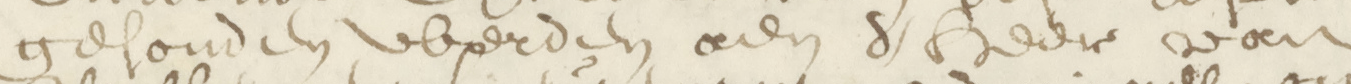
gesonden werden aen d'Heer van
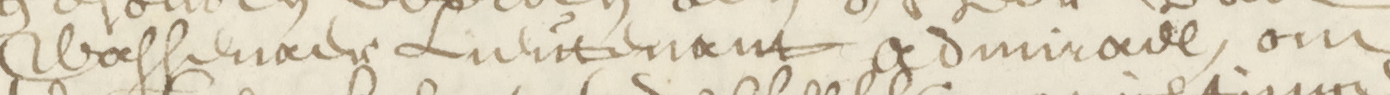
Wassenaer Lieutenant Admirael, om
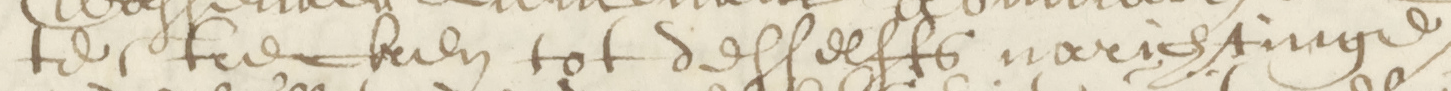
te strecken tot desselffs narichtinge
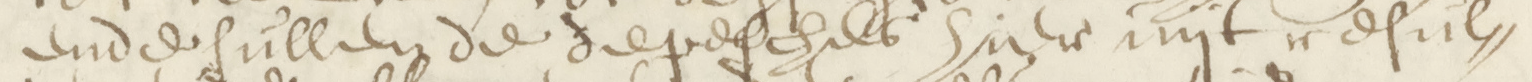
ende sullen de depesches hier uijt resul,,
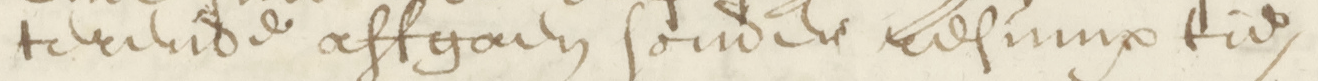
terende affgaen sonder resumptie.
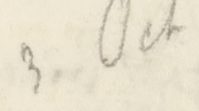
3. Oct
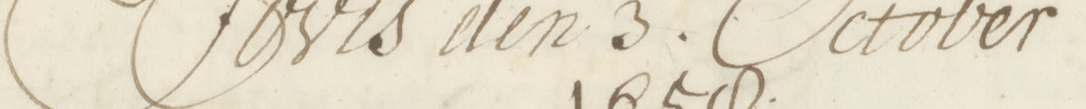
Jovis den 3en. October
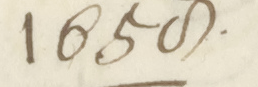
1658.
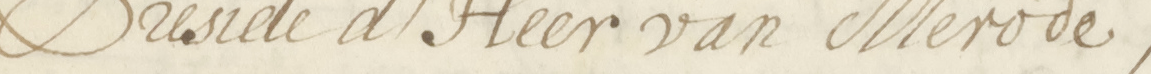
Preside d'Heer van Merode,
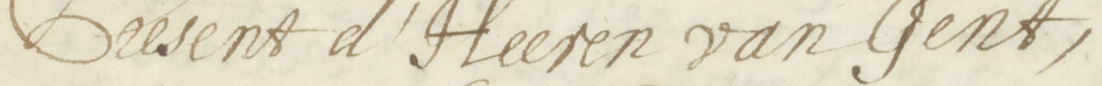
Present d'Heeren van Gent,
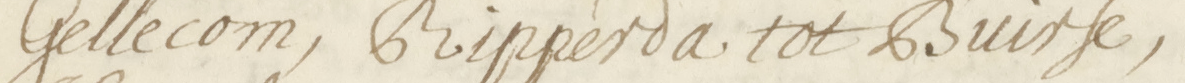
Gellecom, Ripperda tot Buirse,
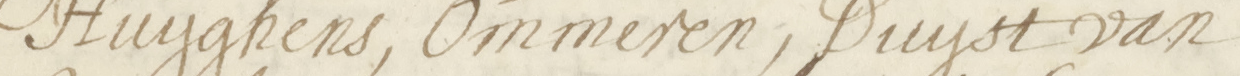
Huyghens, Ommeren, Duyst van
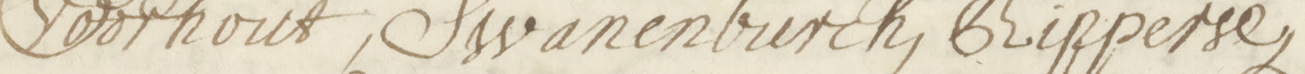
Voorhout, Swanenburch, Ripperse,
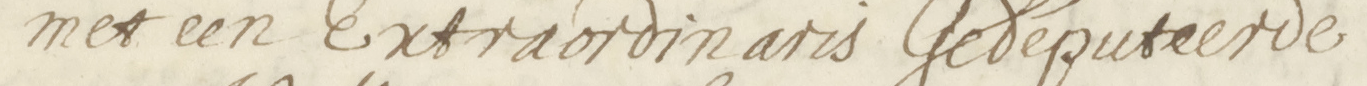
met een Extraordinaris Gedeputeerde
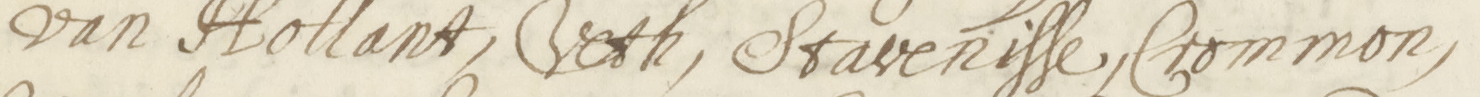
van Hollant, Veth, Stavenisse, Crommon,
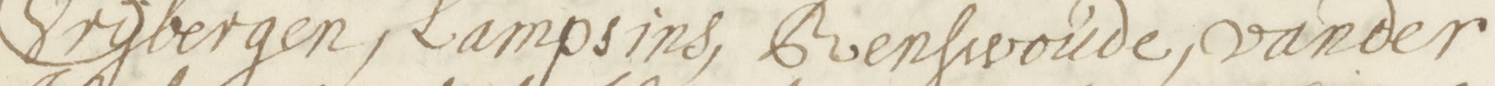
Vrijbergen, Lampsins, Renswoude, vander
